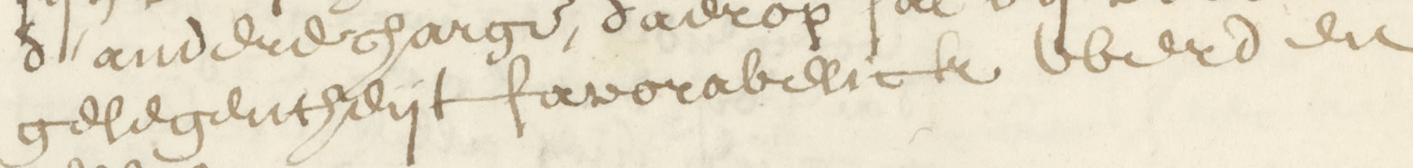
gelegentheijt favorabelick werden
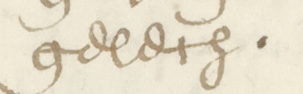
geleth.
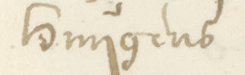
huijgens
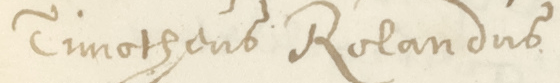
Timotheus Rolandus
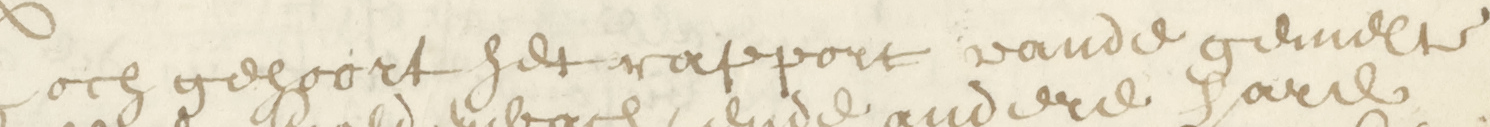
Noch gehoort het rapport vande gemelte
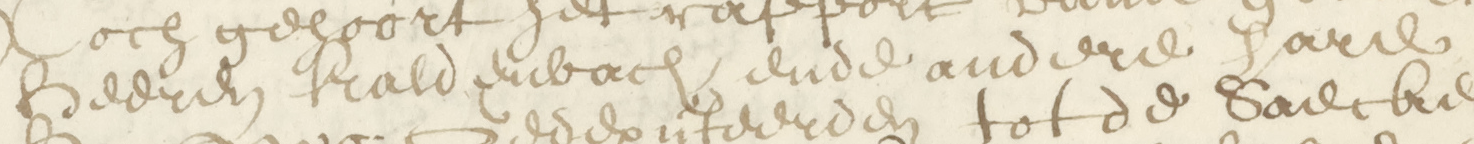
Heeren Kaldenbach, ende andere hare
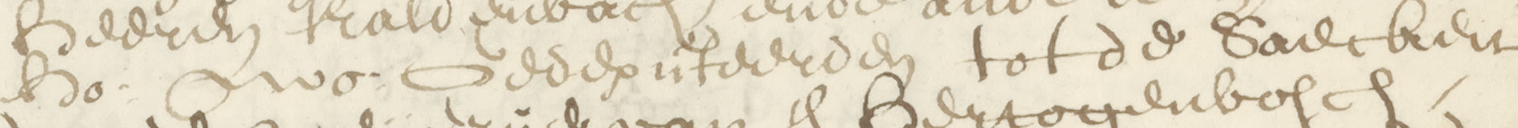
Ho:Mo: Gedeputeerden tot de Saecken
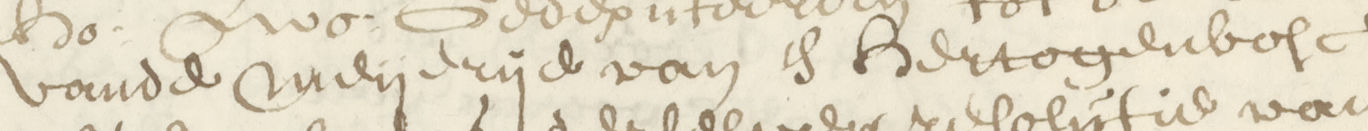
vande meijerije van ‛s Hertogenbosch,
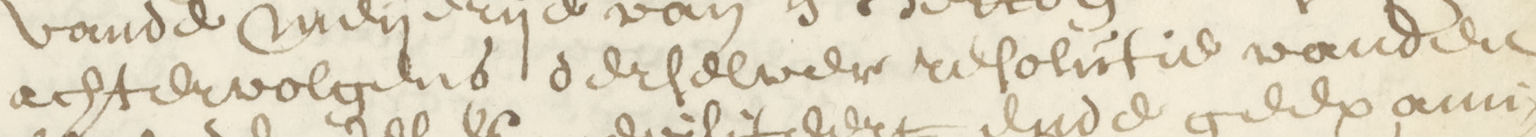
achtervolgens derselver resolutie vanden
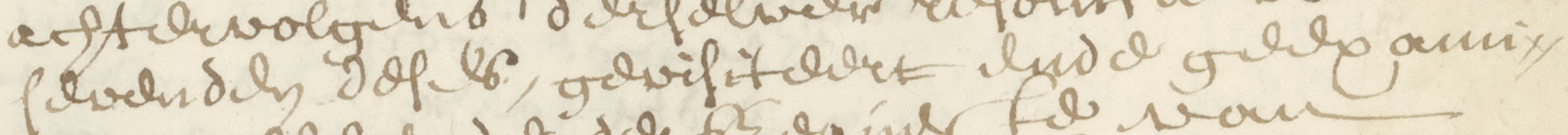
sevenden deses, gevisiteert ende geexami„
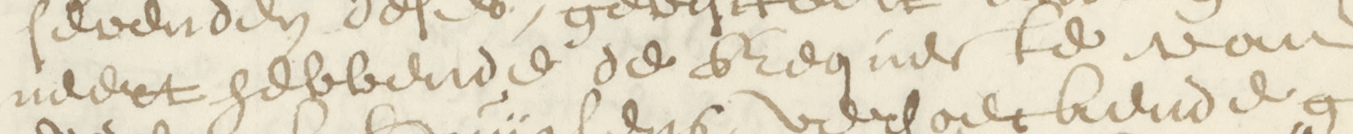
neert hebbende de Requeste van
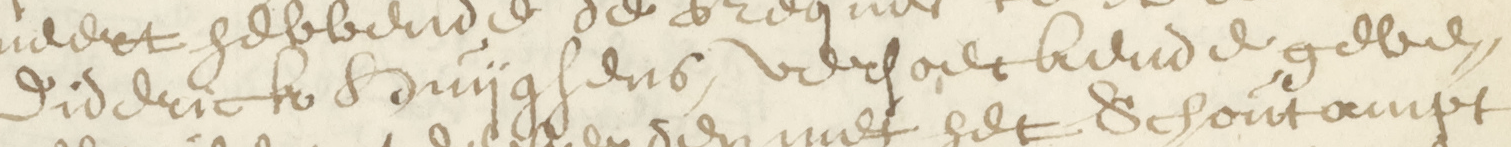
Diderick Huijghens, versoeckende gebe„
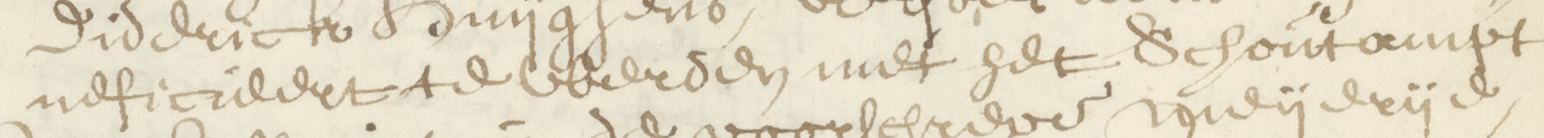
neficieert te werden met het Schoutampt
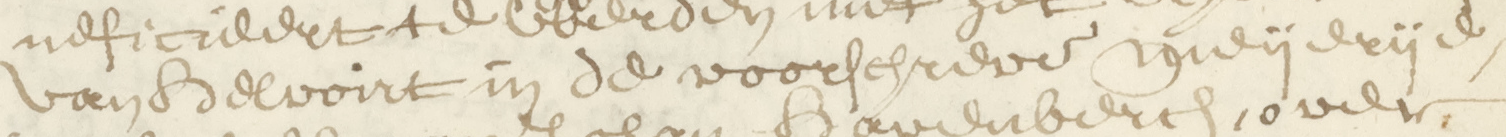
van Helvoirt in de voorschreve meijerije,
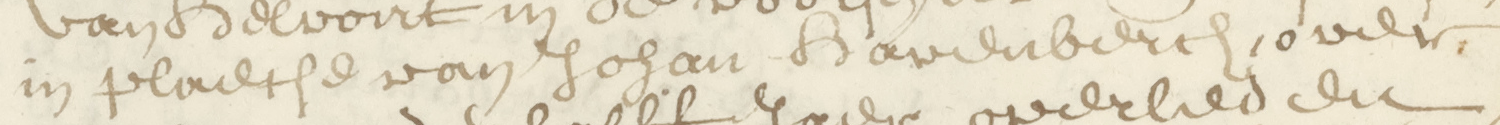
in plaetse van Johan Havenberch, over
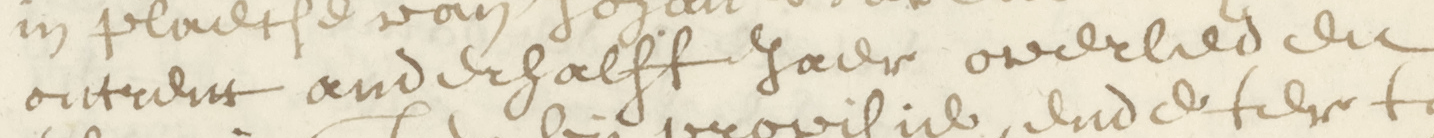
ontrent anderhalff Jaer overleden
